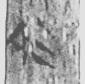八十=
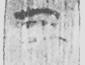三
